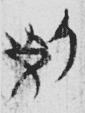死
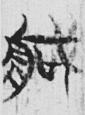○（莊）
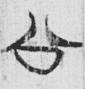公
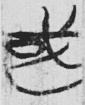或（又）
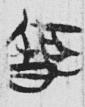䎽（問）
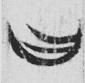曰
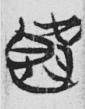既
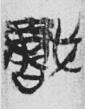○（戰）
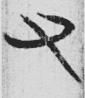又（有）
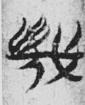幾（忌）
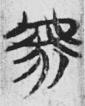{虍介}
